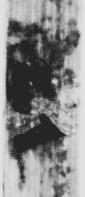㠯（以）
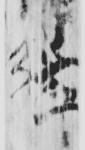{弓㞷}
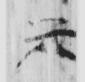亓
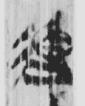道
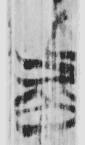𢝬
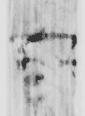夂
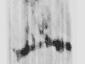之
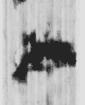㠯（以）
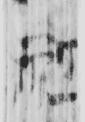{示工}
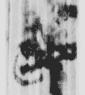母
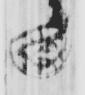面
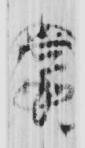{京心}
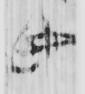母
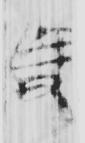拃
